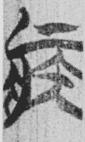疾
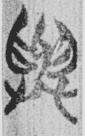與
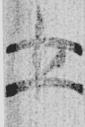才（哉）
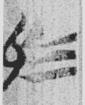於
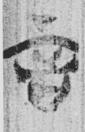言
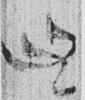又（有）
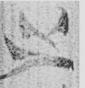之
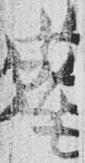○（顑）
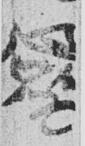○（頷）
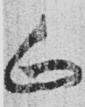㠯（以）
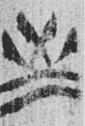至
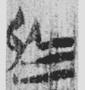於
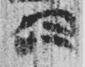含（今）
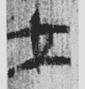才（哉）
